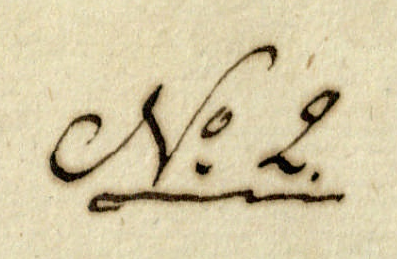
No 2.
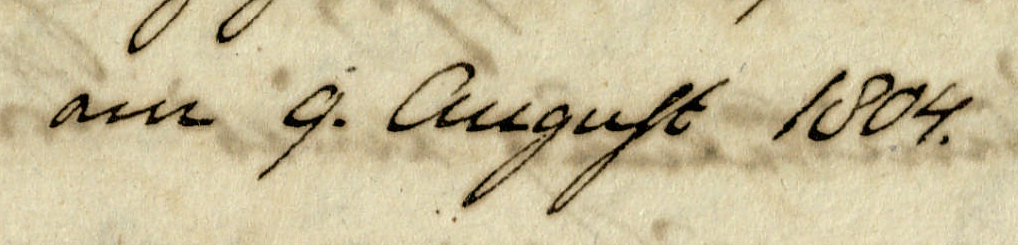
am 9. August 1804.
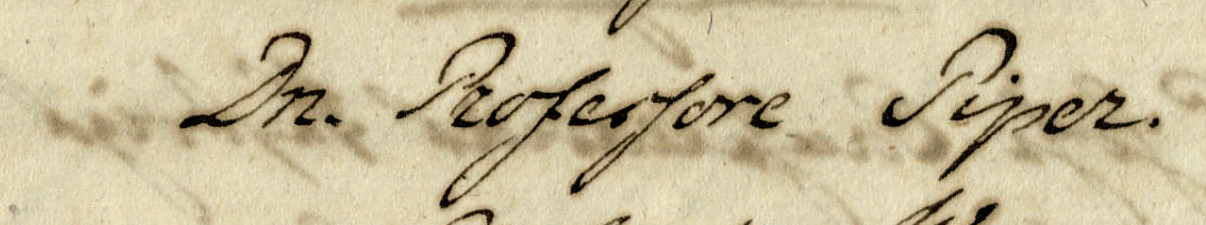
Dn. Professore Piper.
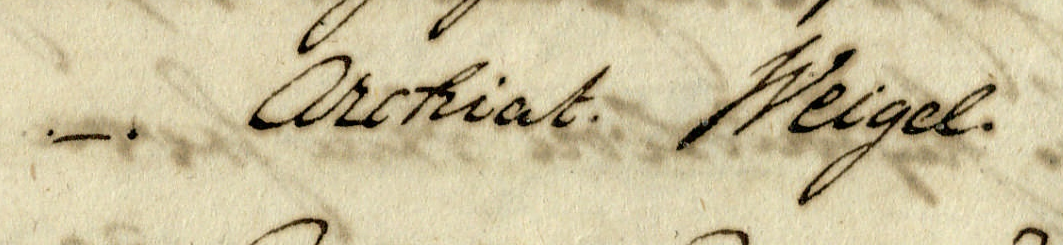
Archiat. Weigel.
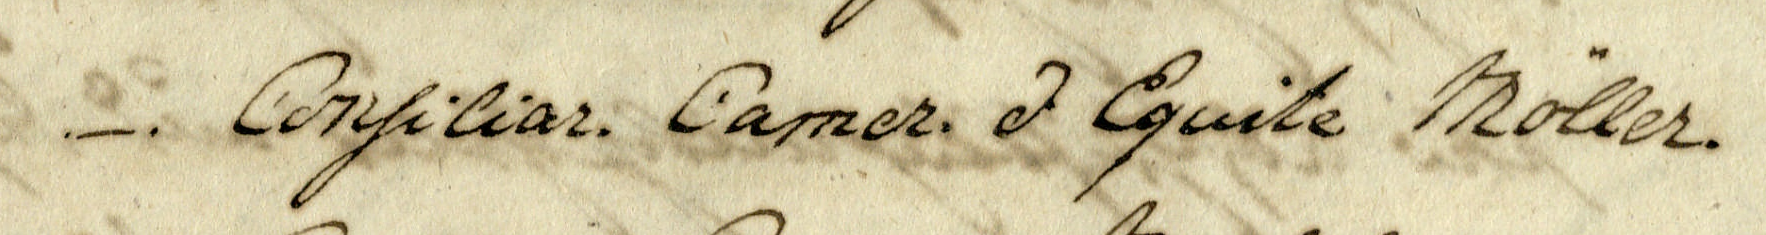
Consiliar. Camer. et Equite Möller.
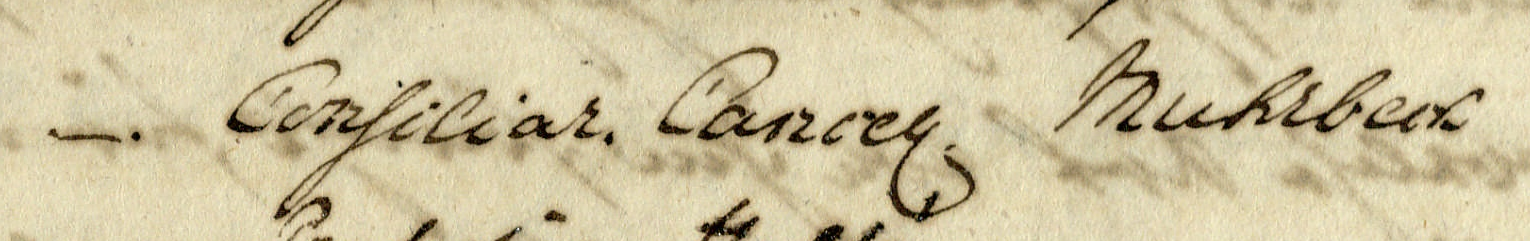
Cinsiliar. Cancel. Muhrbeck
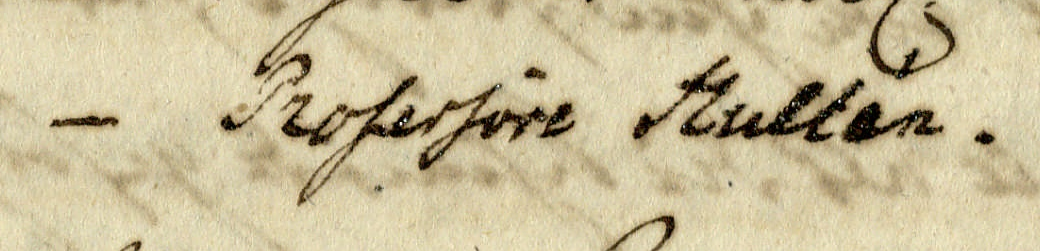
Professore Hultén.
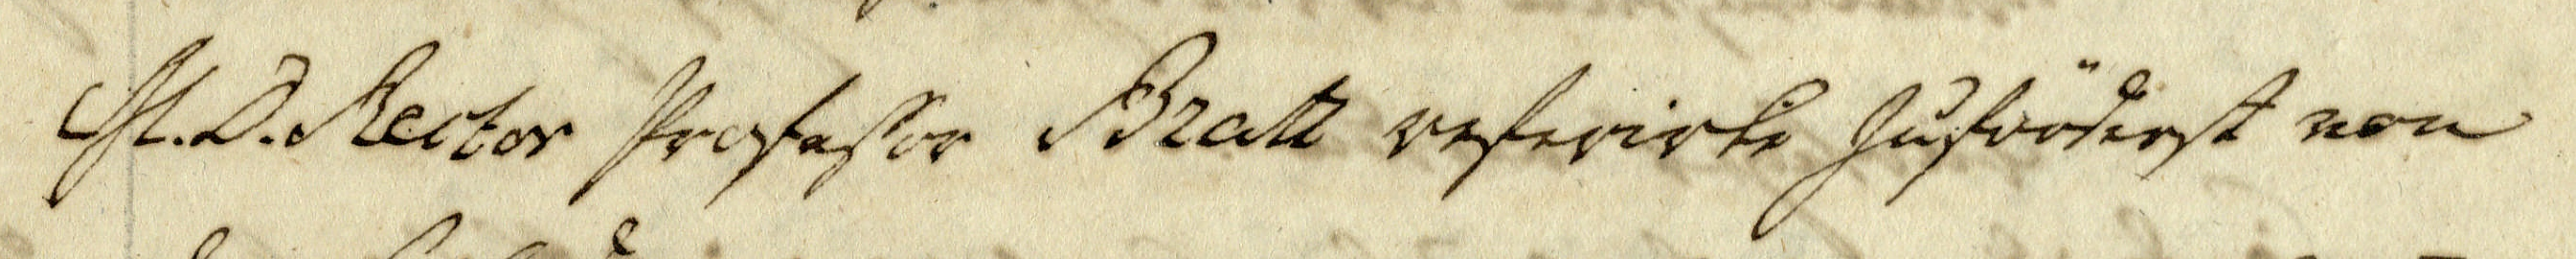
M D. Rector Professor Bratt referirte zuförderst von
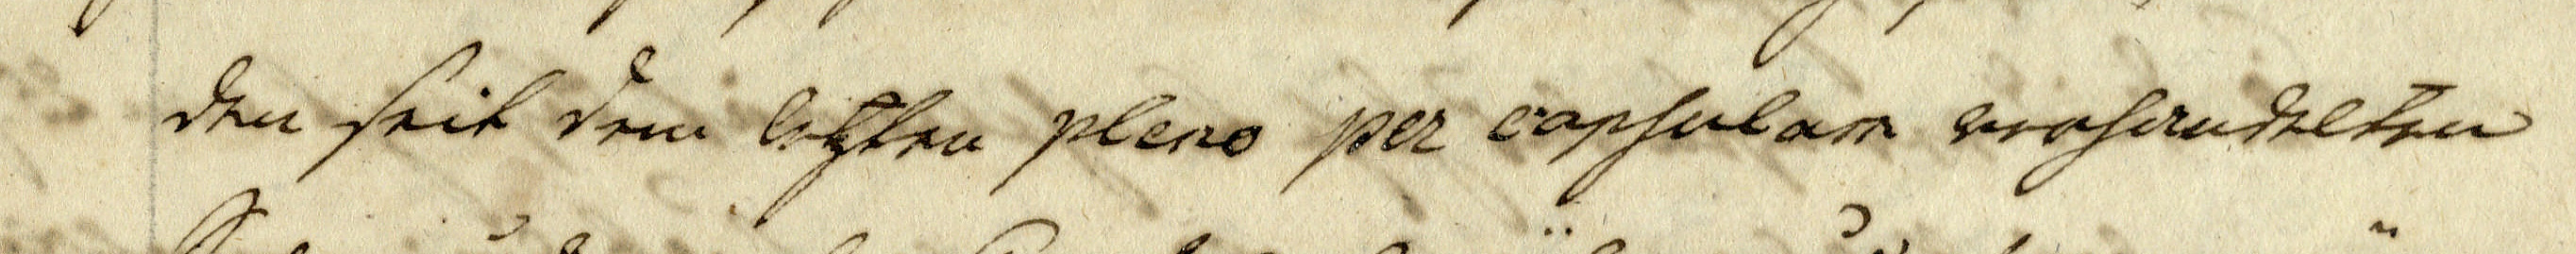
den seit dem letzten pleno per capsulam verhandelten
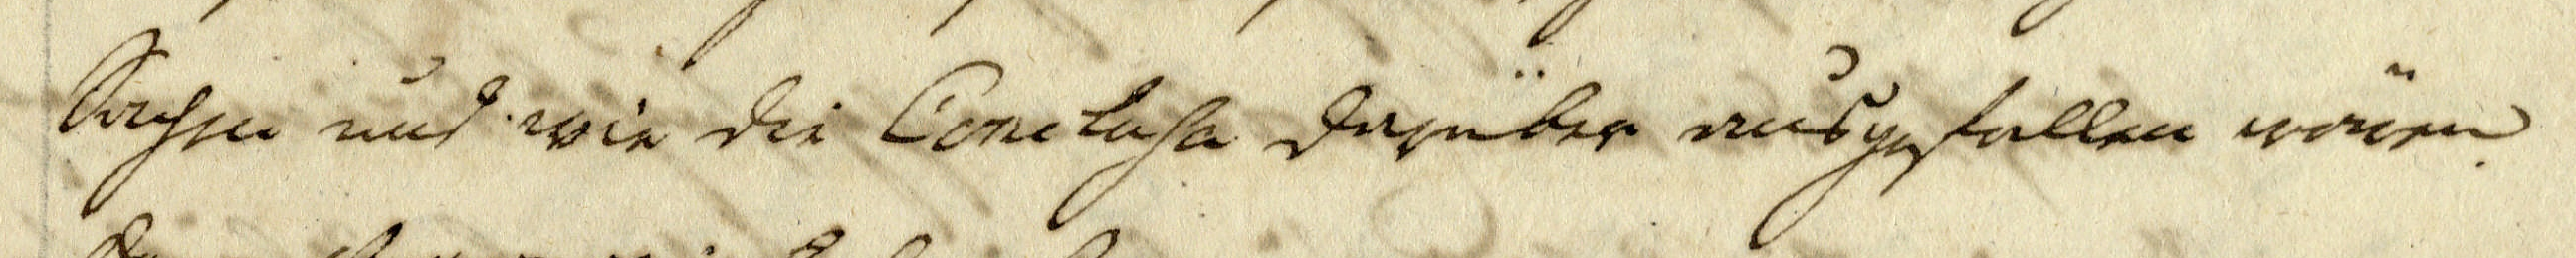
Sachen und wie die Conclusa darüber ausgefallen wären.
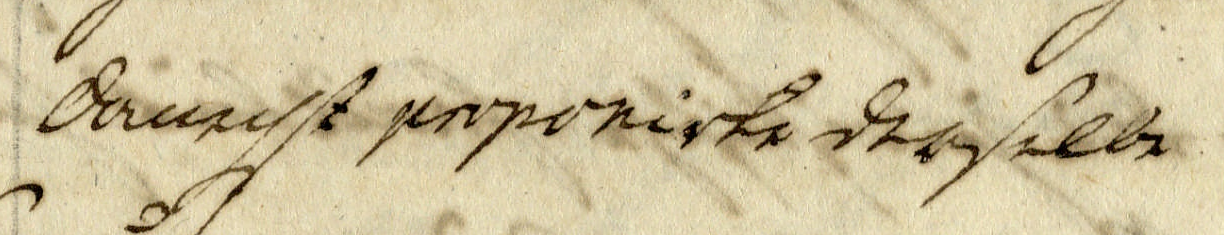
Danechst proponirte derselbe
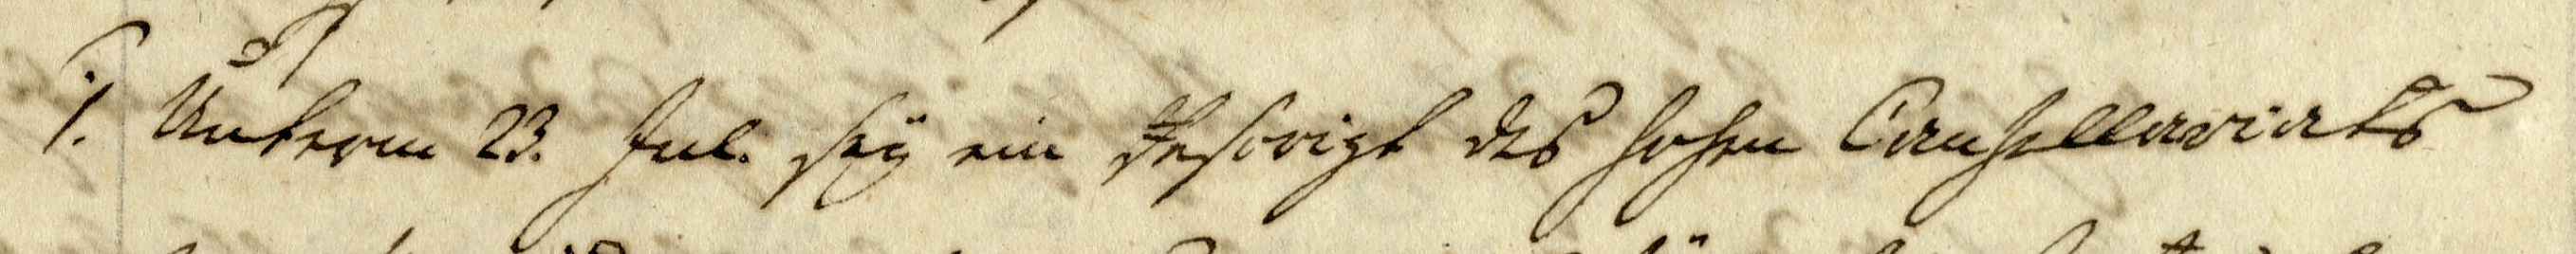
1. Unterm 23. Jul. seÿ ein Rescript des hohen Canzellariats
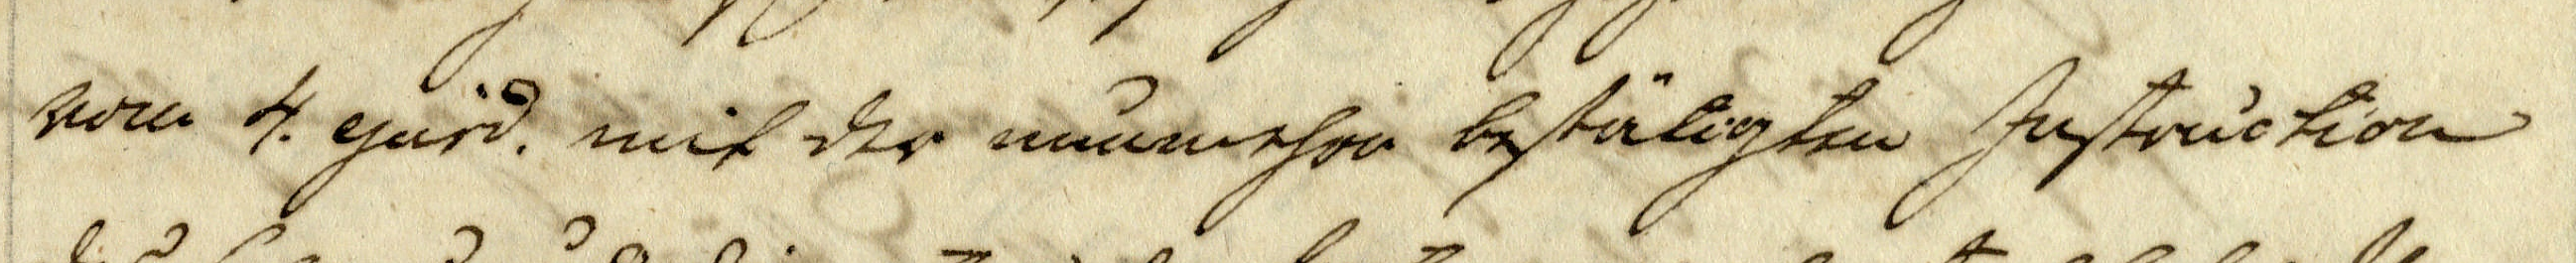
vom 4. ejusd. mit der nunmehro bestätigten Instruction
